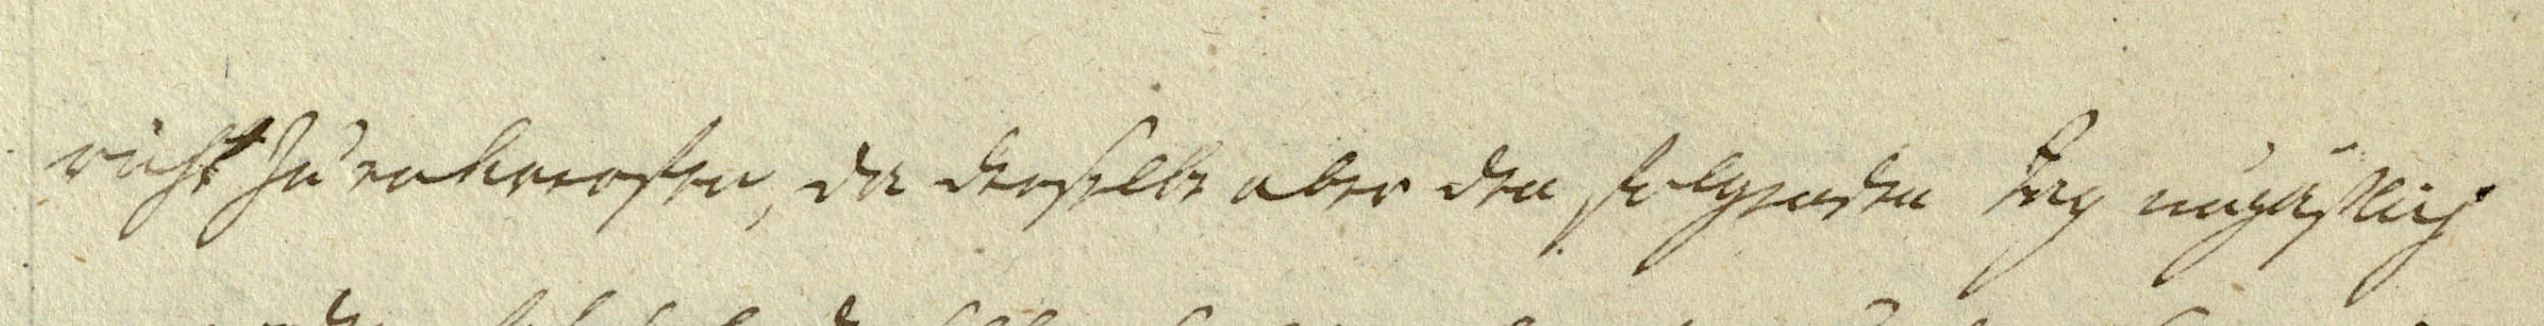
richt zu entwerfen, da derselbe aber den folgenden Tag unpäßlich
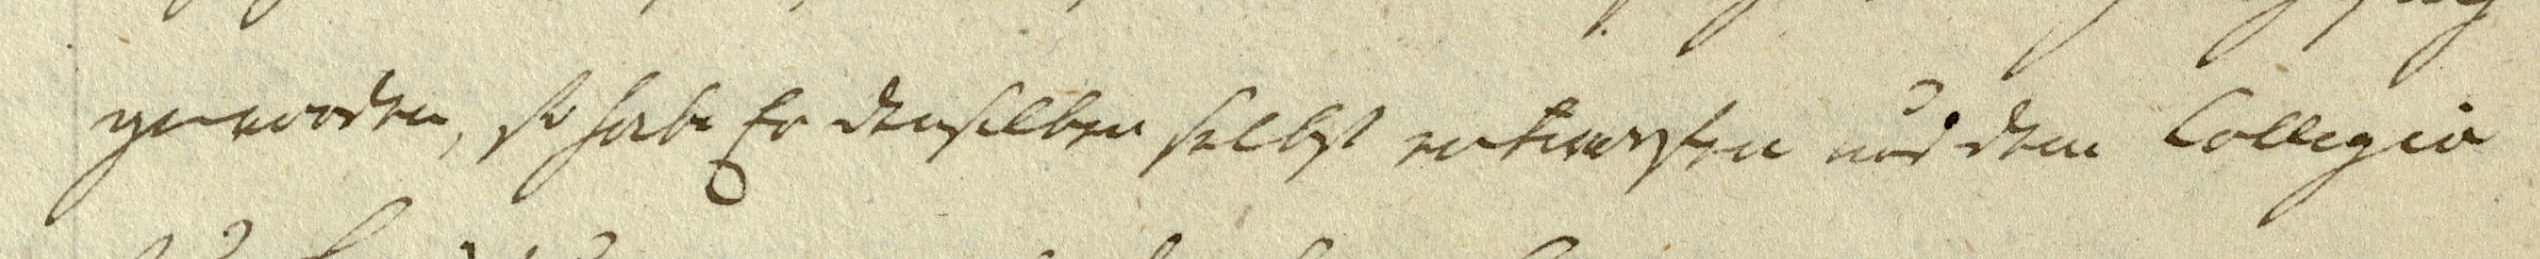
geworden, so habe Er denselben selbst entworfen und dem Collegio
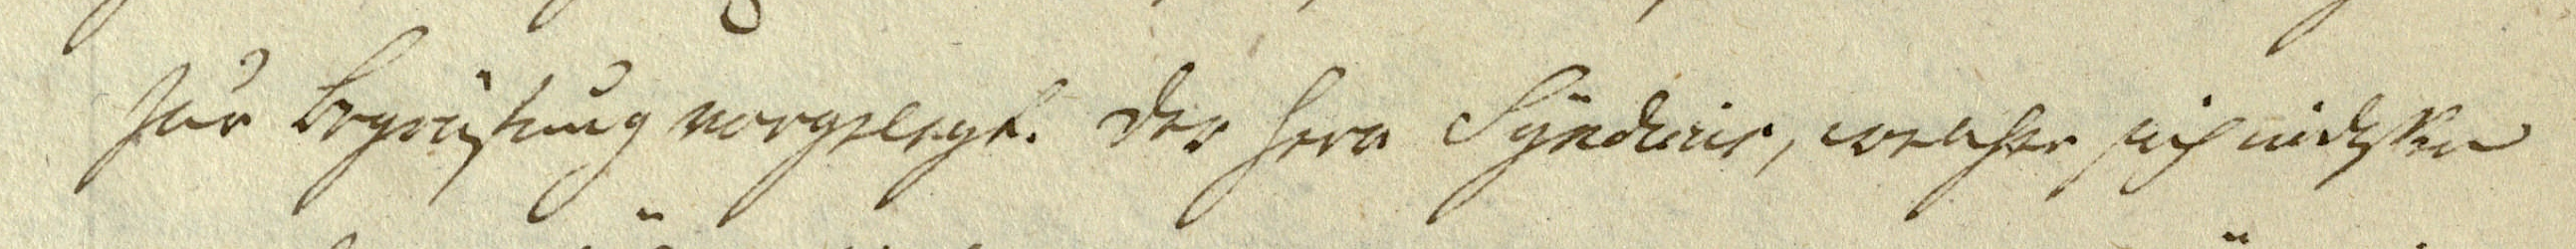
zur Beprüfung vorgelegt. Der Herr Sÿndicus, welcher sich indessen
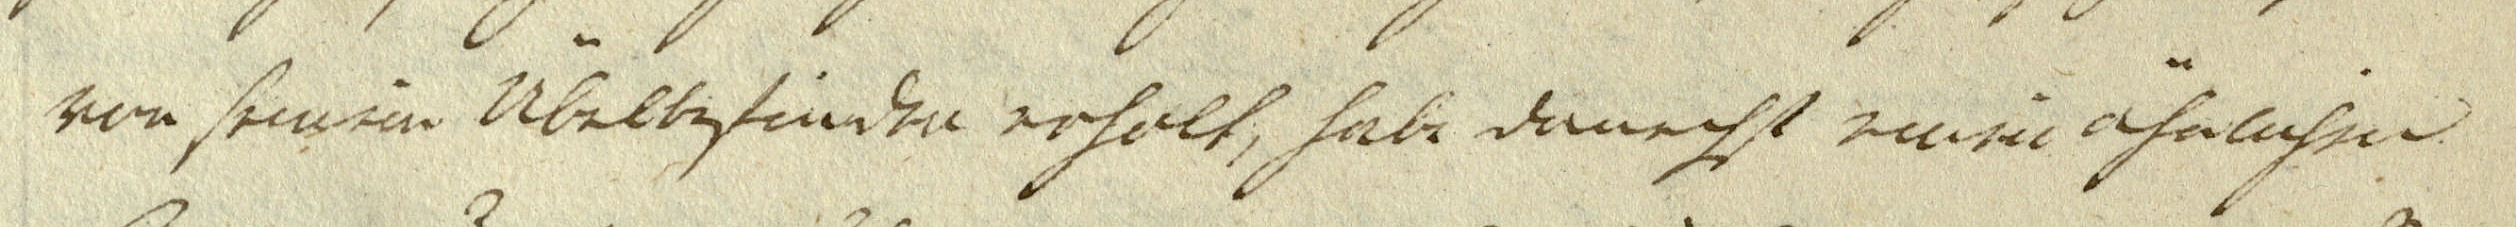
von seinem Übelbefinden erholt, habe danechst einen ähnlichen
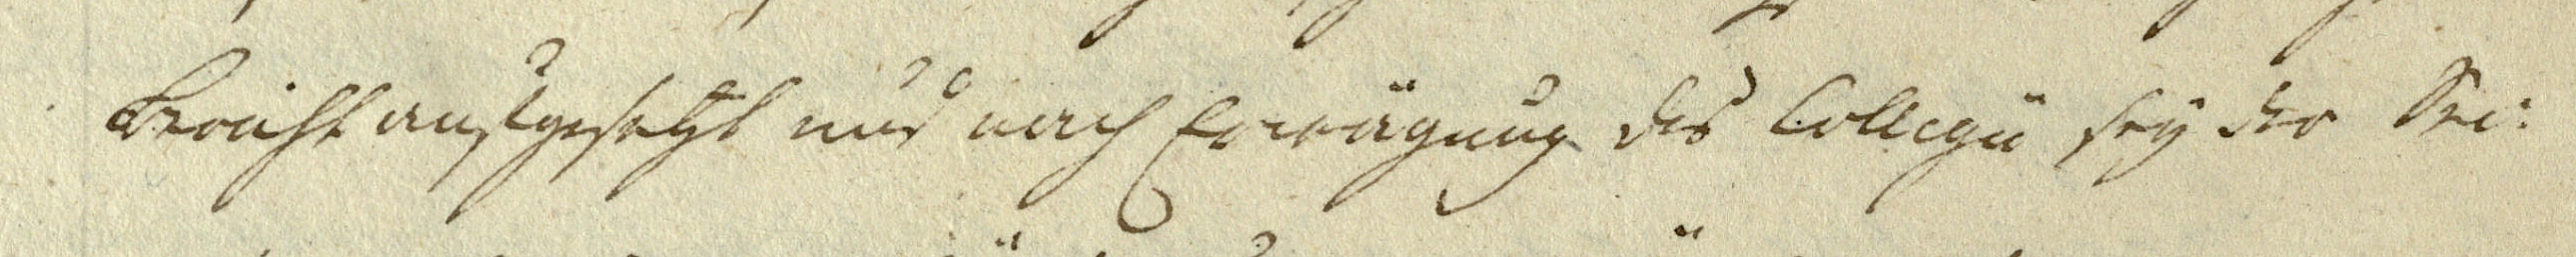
Bericht ausgesetzt und nach Erwägung des Collegii seÿ der Sei¬
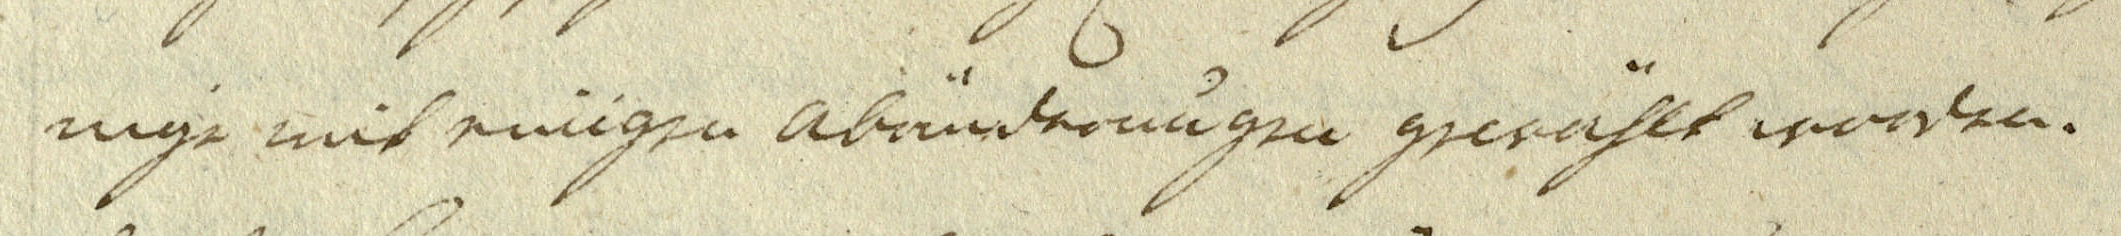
nige mit einigen Abänderungen gewählt worden.
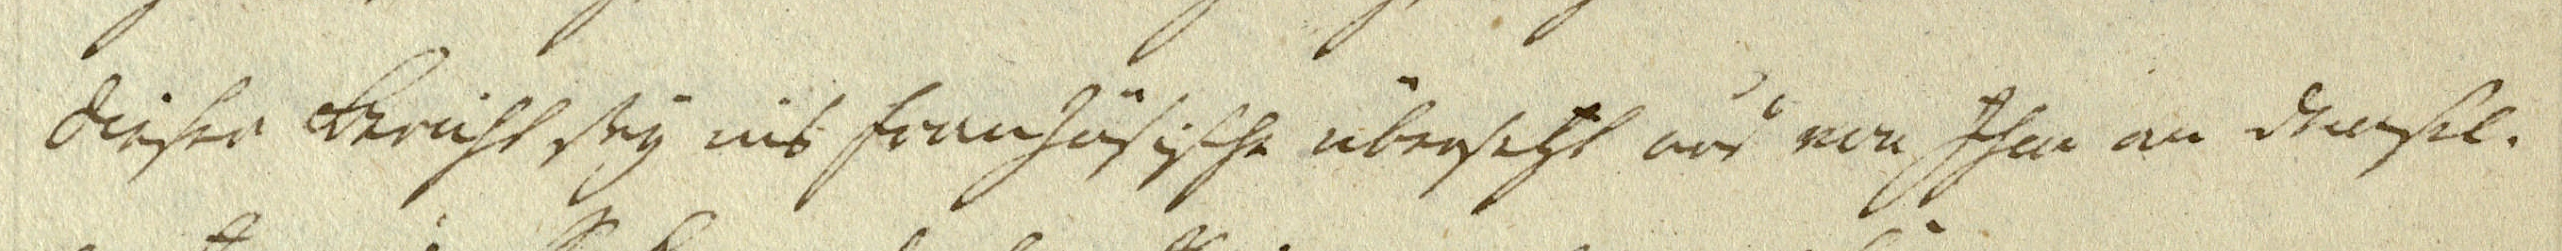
Dieser Bericht seÿ ins Französische übersetzt und von Ihm an densel¬
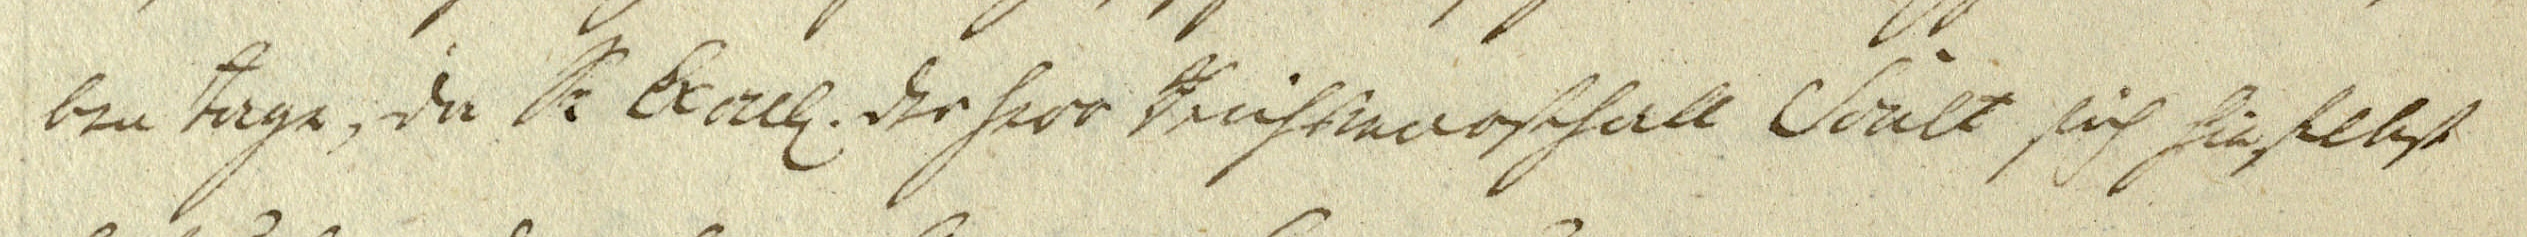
ben Tage, da Sr Excell. der Herr Reichsmarschall Soult sich hieselbst
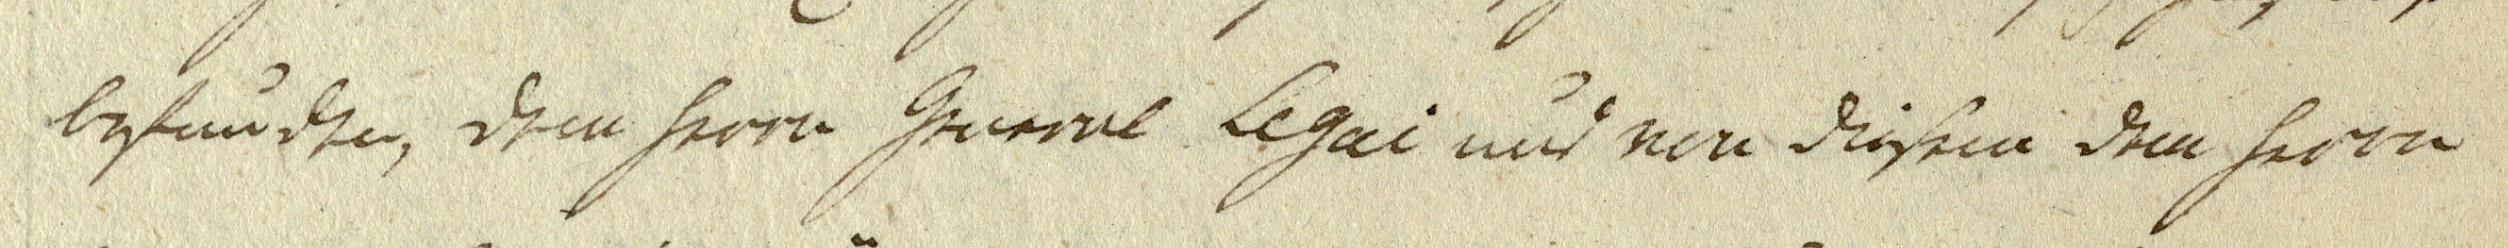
befunden, dem Herrn General Legai und von diesem dem Herrn
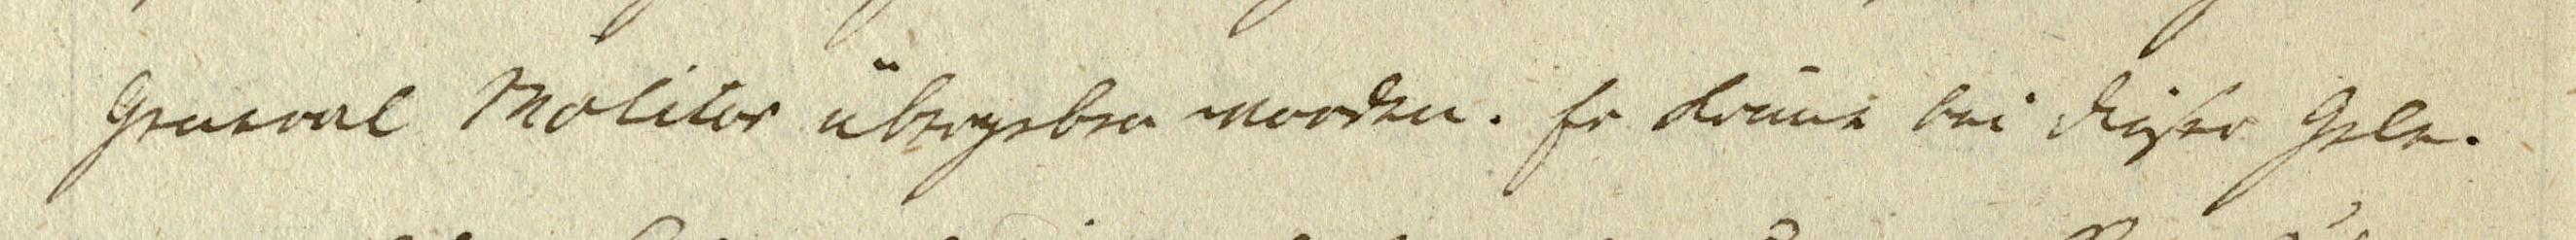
General Molitor übergeben worden. Er könne bei dieser Gele¬
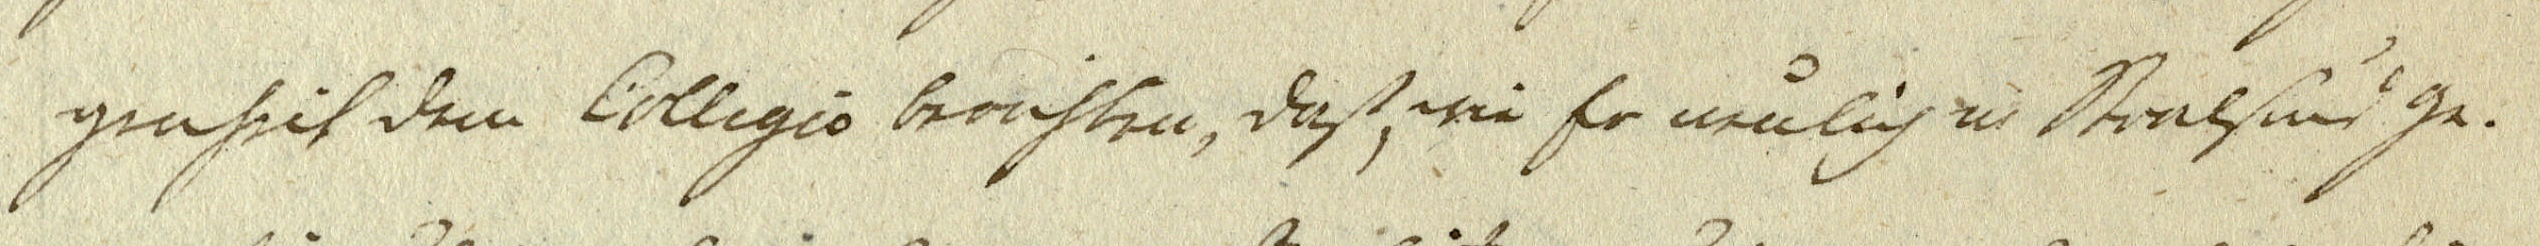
genheit dem Collegio berichten, daß, wie Er neulich in Stralsund ge¬
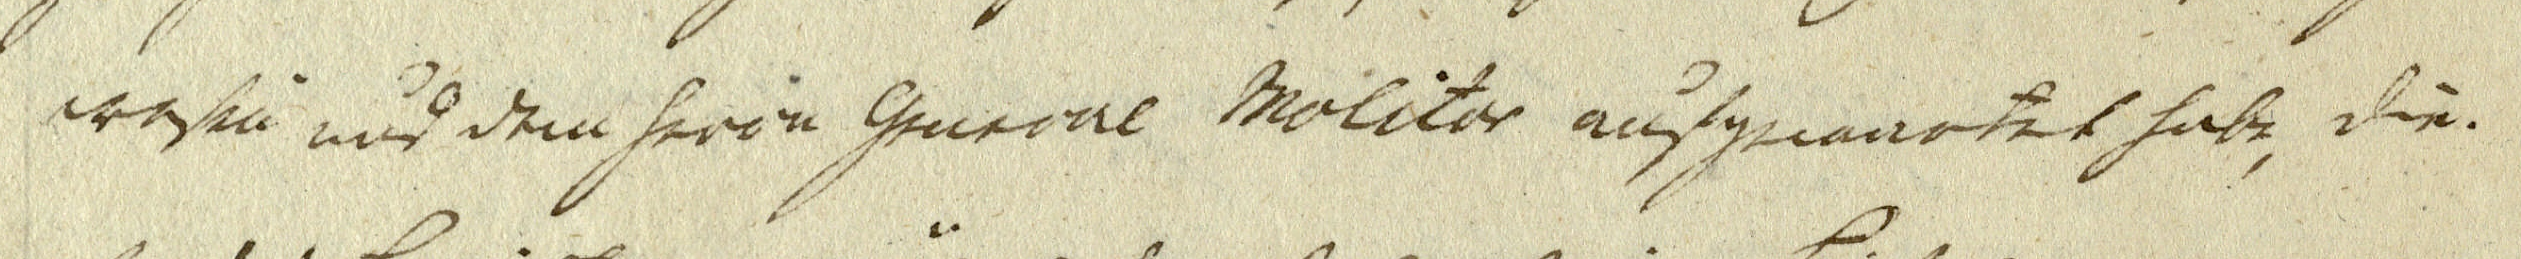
wesen und dem Herrn General Molitor aufgewartet habe, die¬
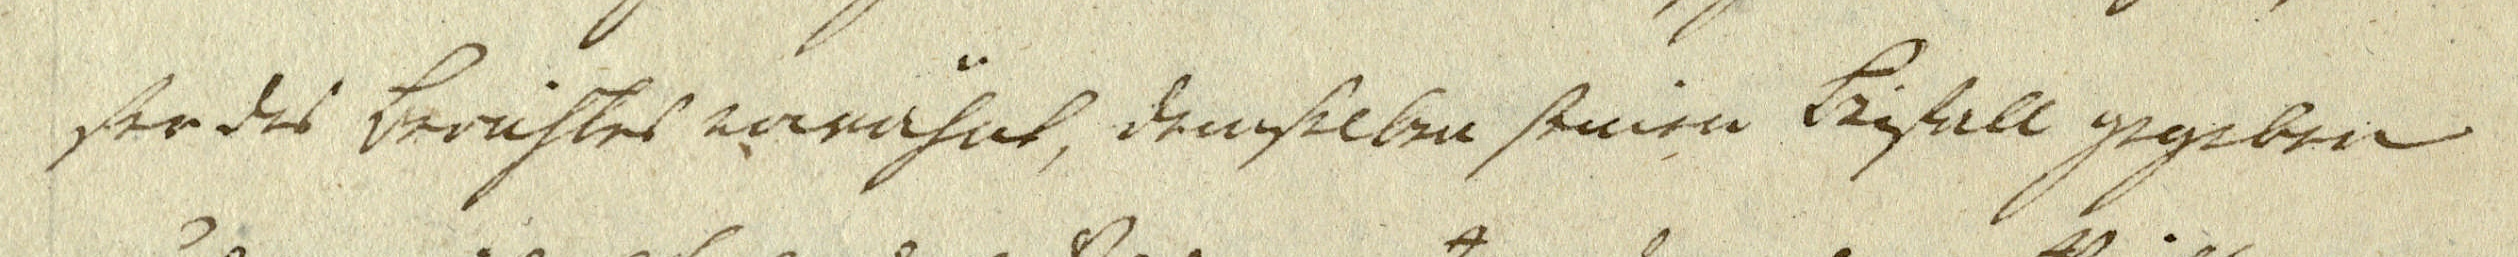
ser des Berichtes erwähnt, demselben seinen Beifall gegeben
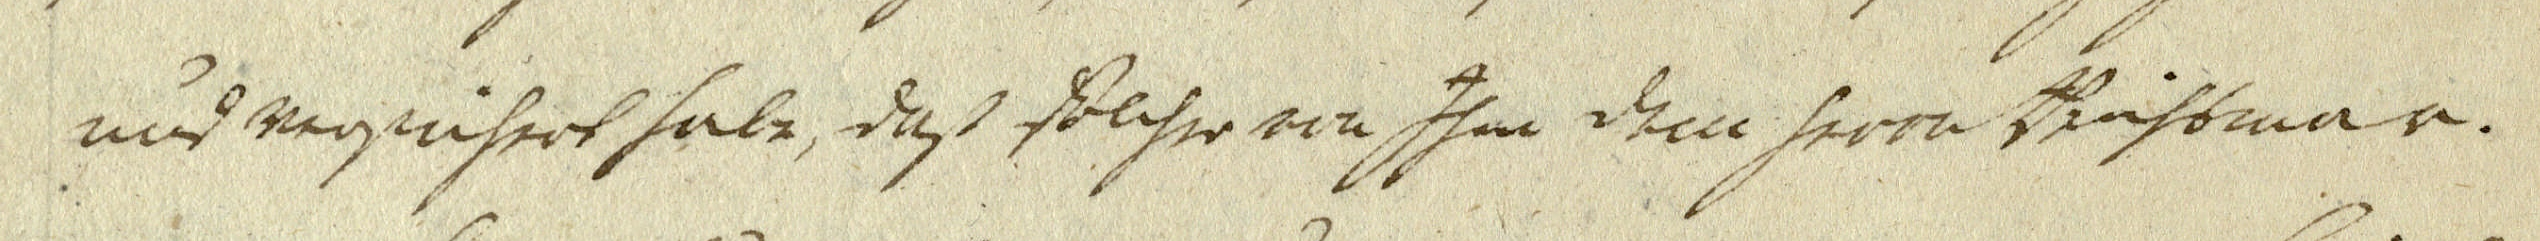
und versichert habe, daß solcher von Ihm dem Herrn Reichsmar¬
